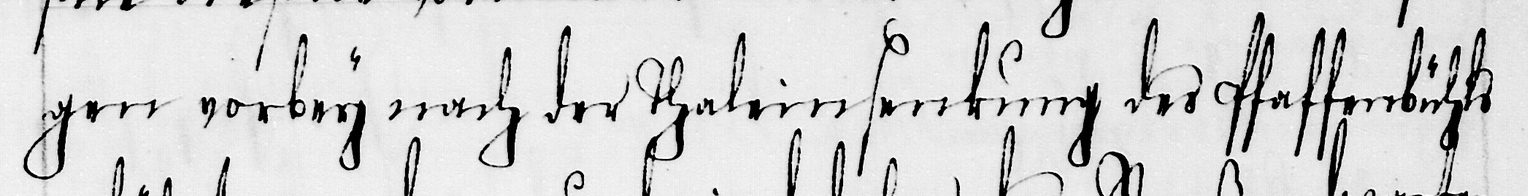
gen vorbey nach der Thaleinsenkung des Pfaffenbühls
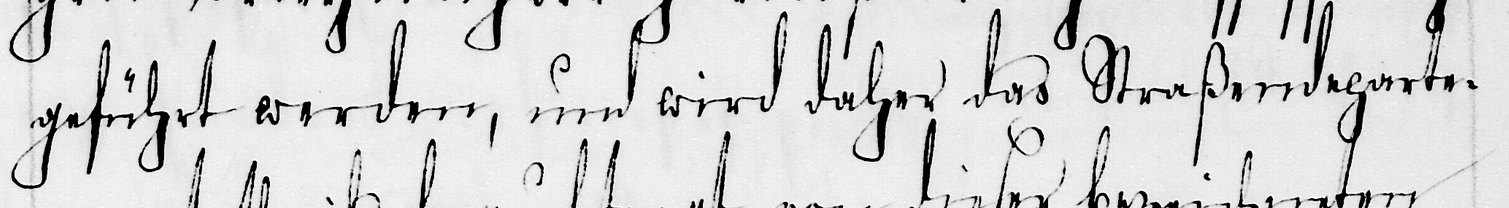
geführt werden, und wird daher das Straßendeparte¬
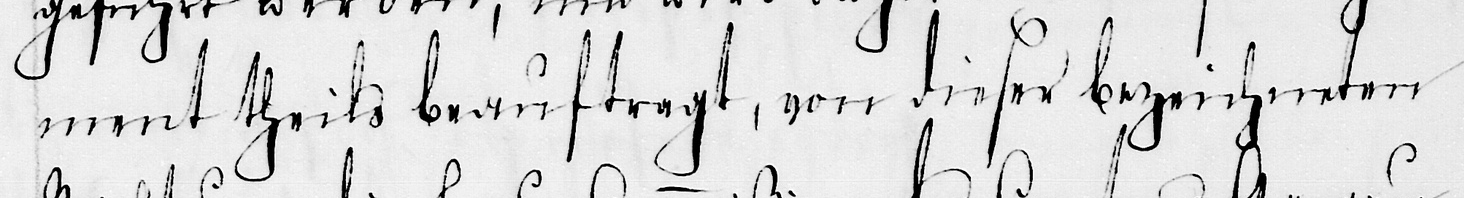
ment theils beauftragt, von dieser bezeichneten
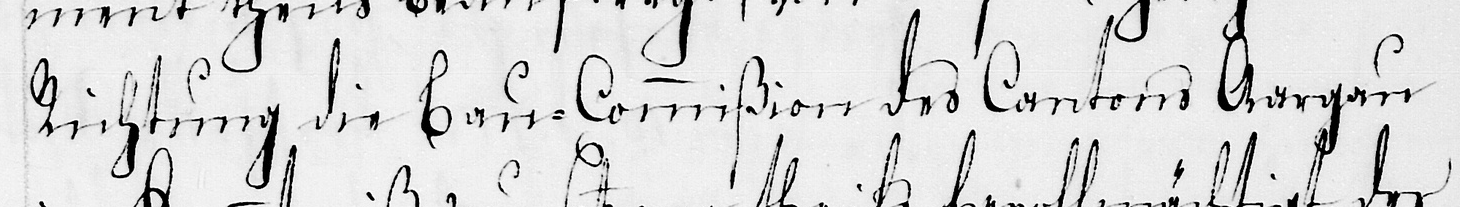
Richtung die Bau-Commißion des Cantons Aargau
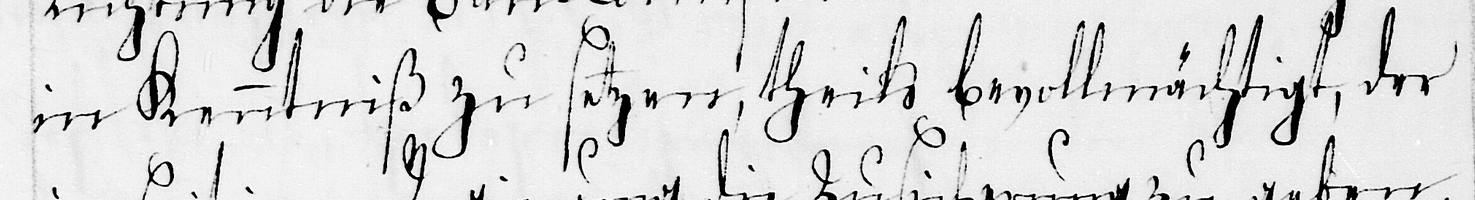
in Kenntniß zu setzen, theils bevollmächtigt, der
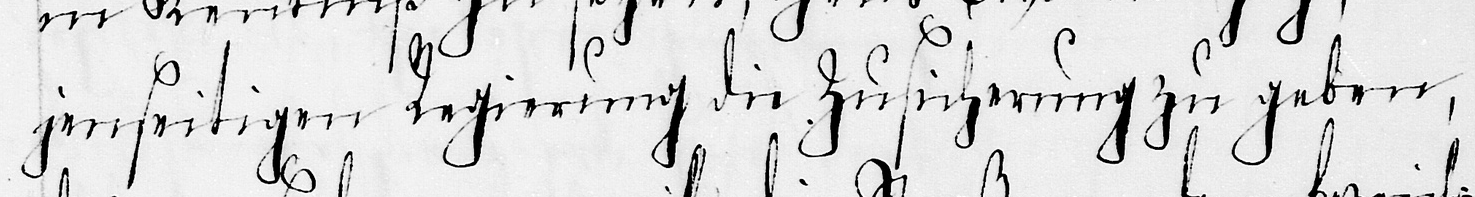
jenseitigen Regierung die Zusicherung zu geben,
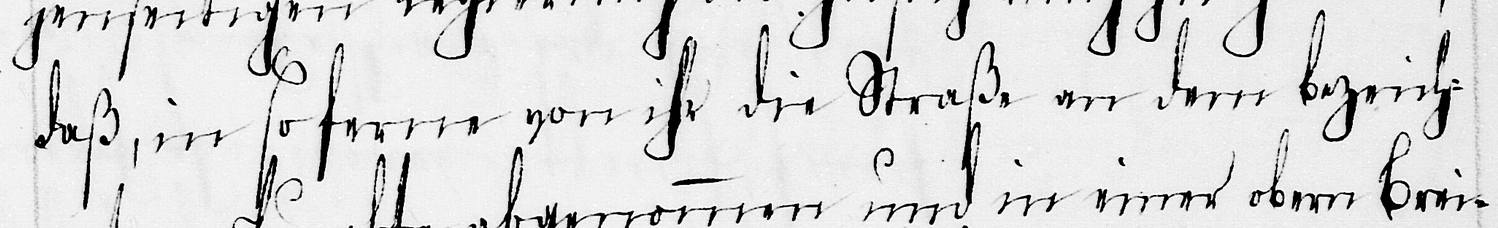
daß, in so ferne von ihr die Straße an dem bezeich¬
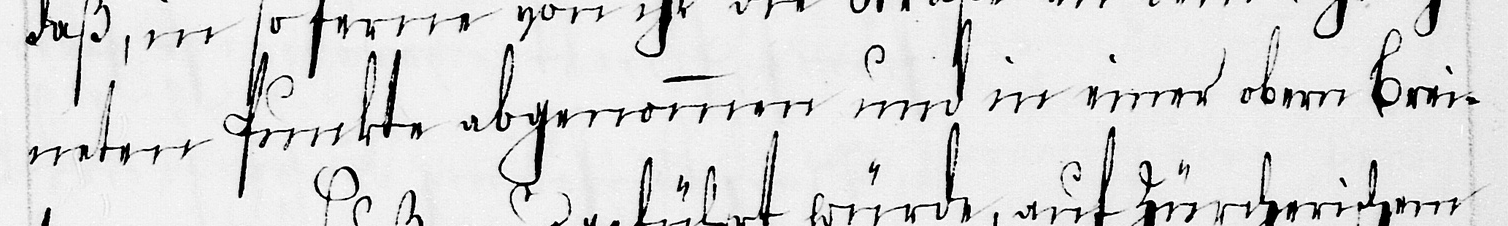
neten Punkte abgenommen und in einer obern Brei¬
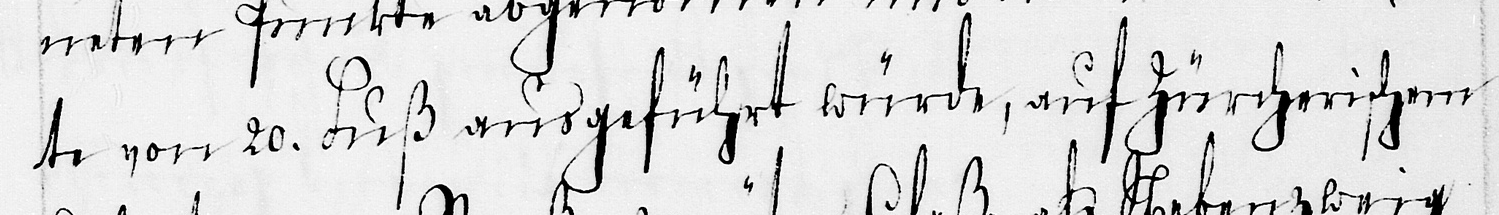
te von 20. Fuß ausgeführt würde, auf Zürcherischem
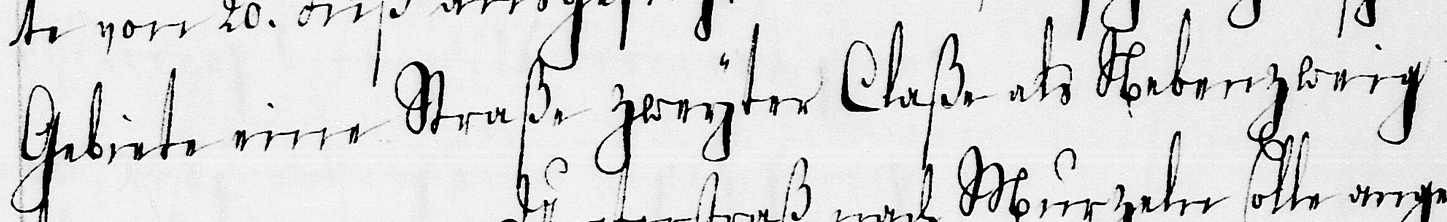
Gebiete eine Straße zweyter Claße als Nebenzweig
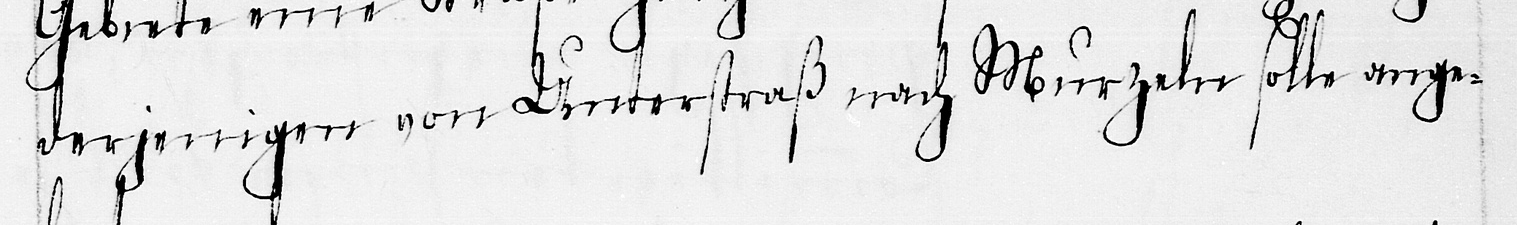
derjenigen von Unterstraß nach Murzeln solle ange¬
